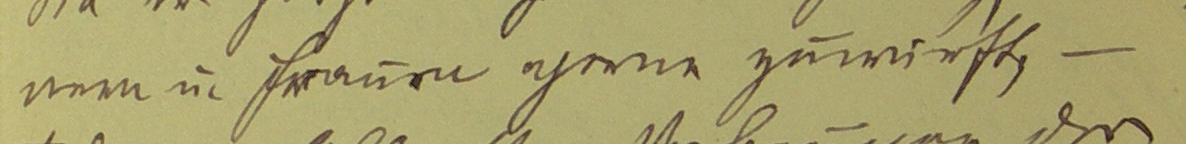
en und Frauen gerne zuwirft,-
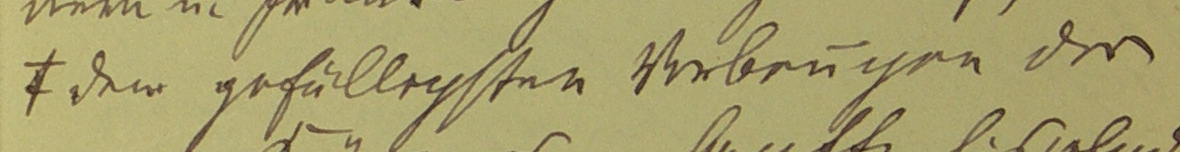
mit den gefäligsten Verbeugenen des
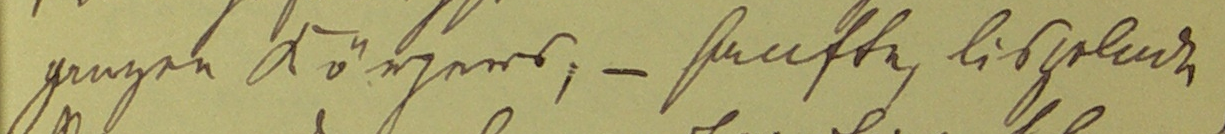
ganzen Körpers;- sanfte, lispelnde
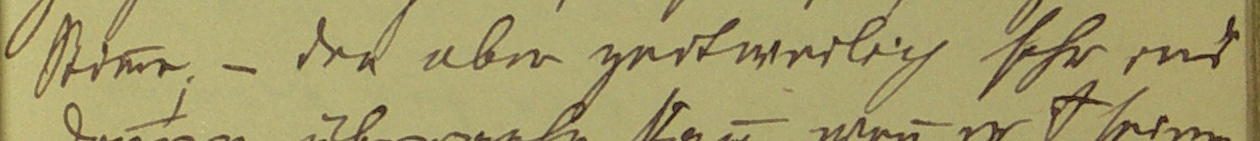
Stimme;- die aber zeitweilig sehr ins
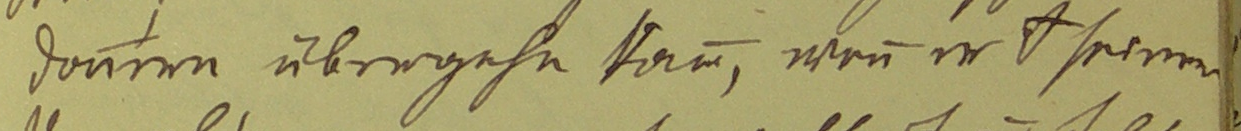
donnern übergehen kann,- wenn er mit seiner
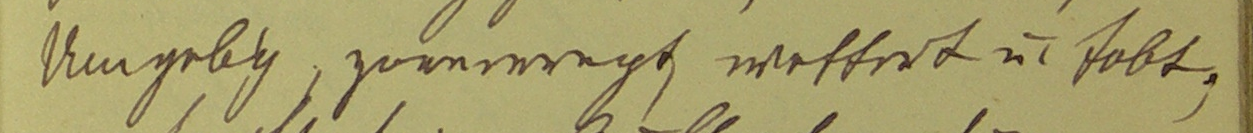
Umgebung zornerregt, wettert und tobt;
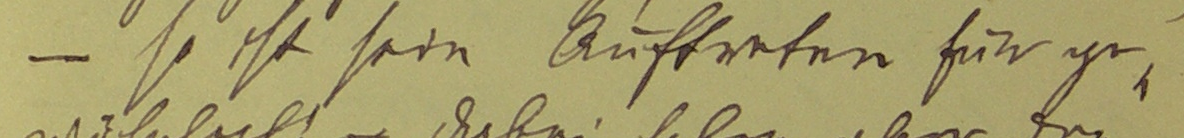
- so ist sein Auftreten für ge¬
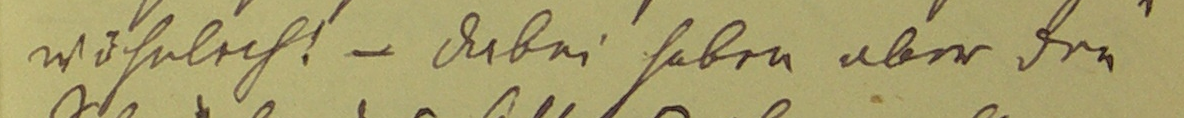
wöhnlich;-Dabei haben aber die
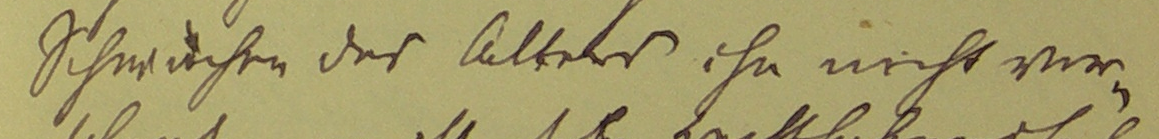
Schwächen des Alters ihn nicht ver¬
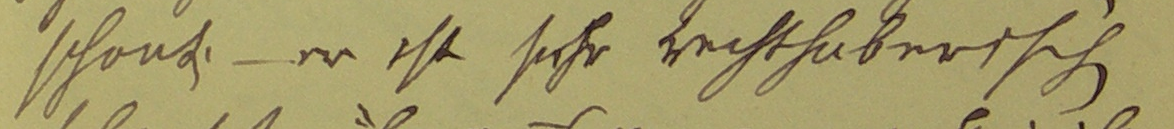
schont - er ist sehr rechthaberisch,
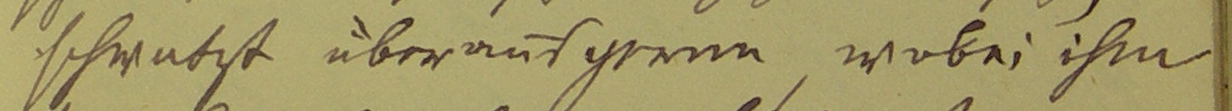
schwatzt überaus gerne, wobei ihm
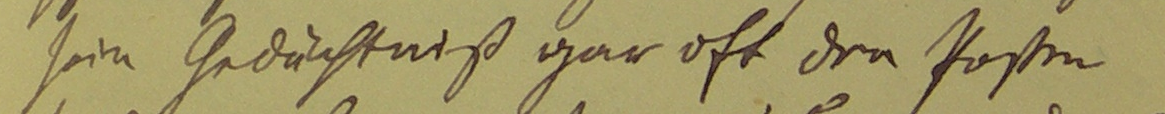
sein Gedächtnis gar oft den Poßen
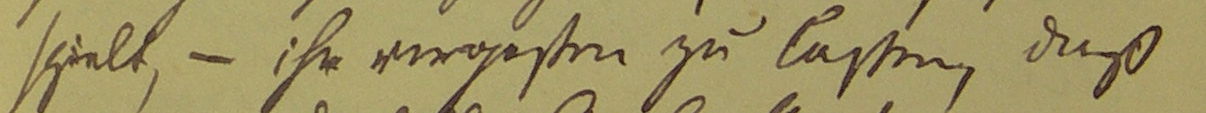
spielt, -ihn vergessen zu lassen, das
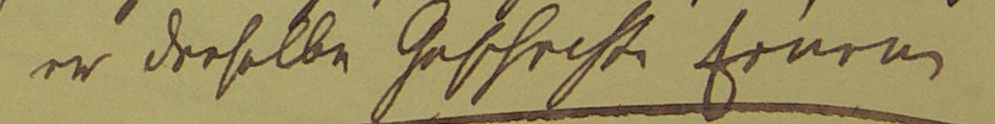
er dieselbe Geschichte eben
